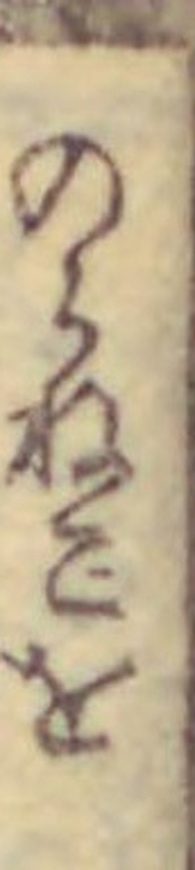のらねこを
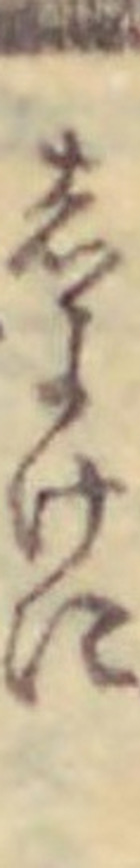しよけに
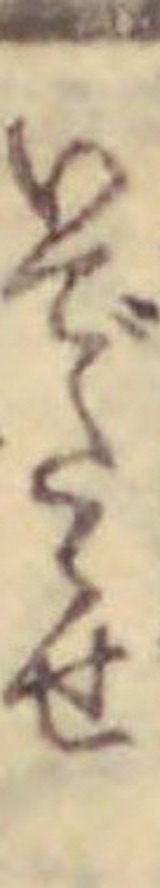いでたゝせ
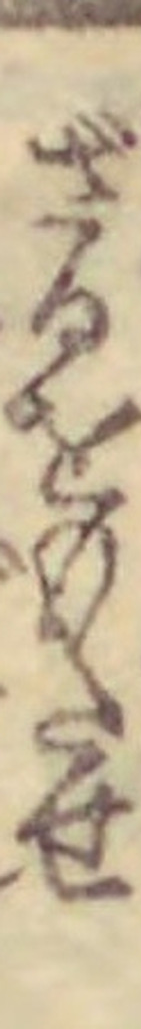ざるをもたせ
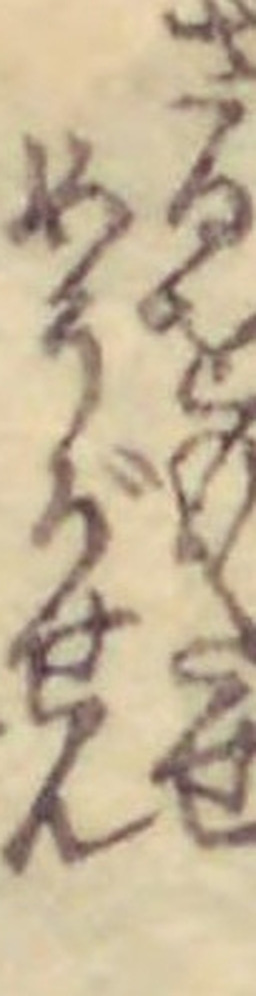めうがせん
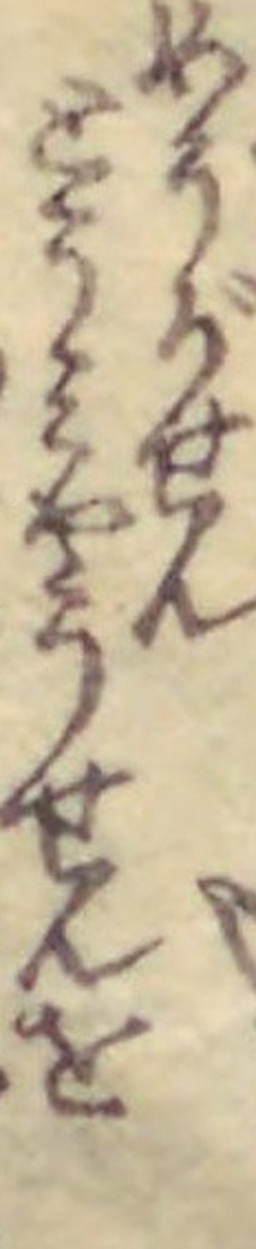とうみやうせんを
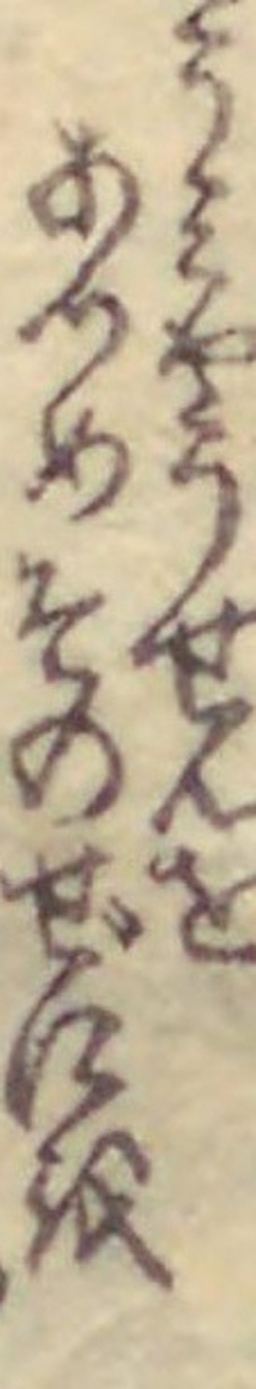あつめそのぜにを
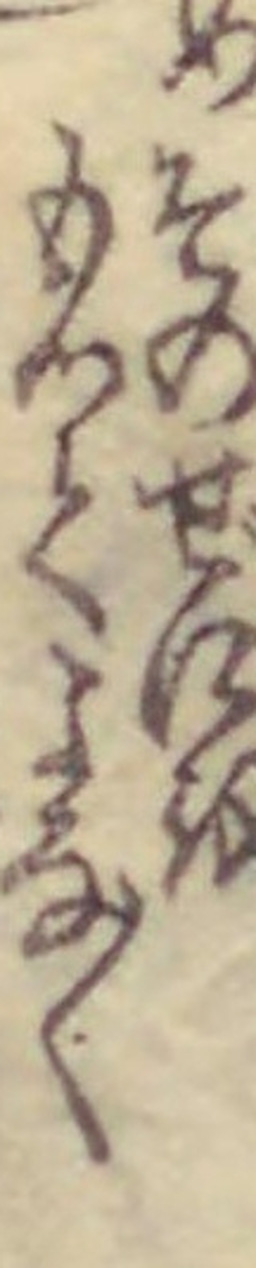もつてよな〳〵
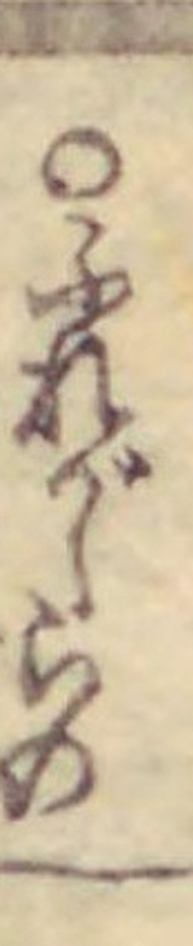○ふれがしらの
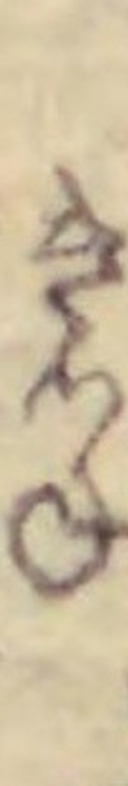きつね
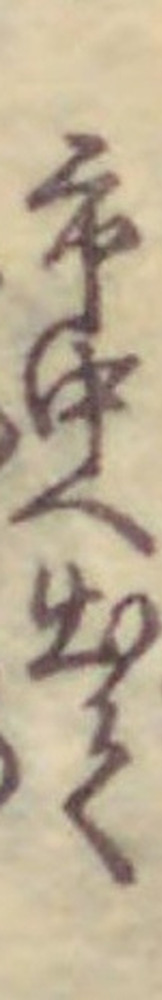市中へ出て
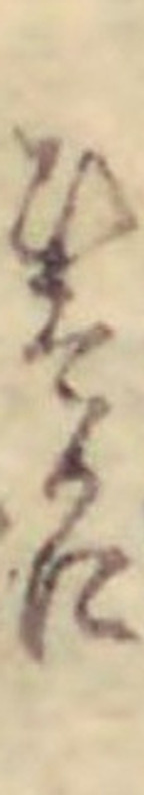ひそかに
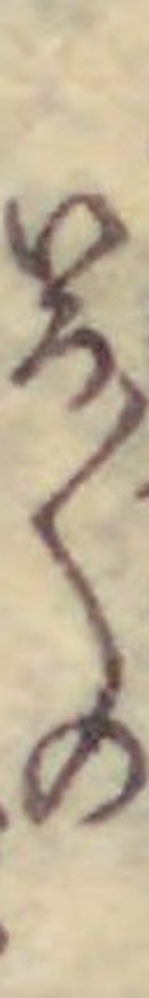いろ〳〵の
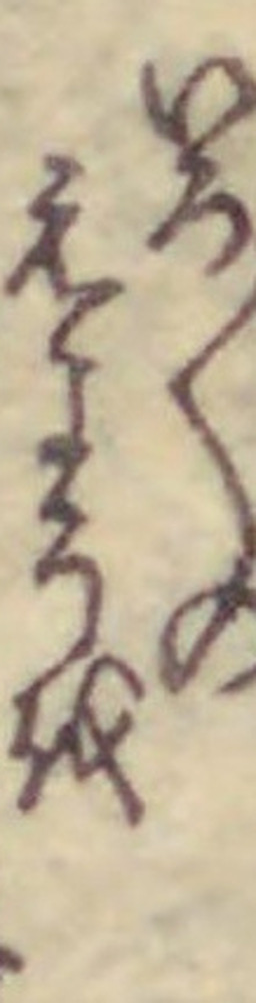えようを
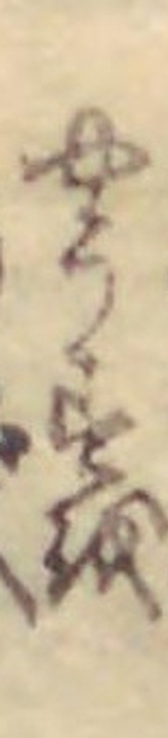やうすを
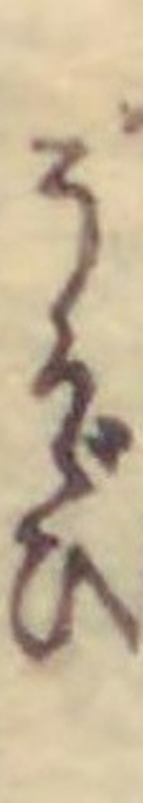うかゞひ
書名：化物世帯氣質
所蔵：国立国会図書館 National Diet Library, JAPAN
